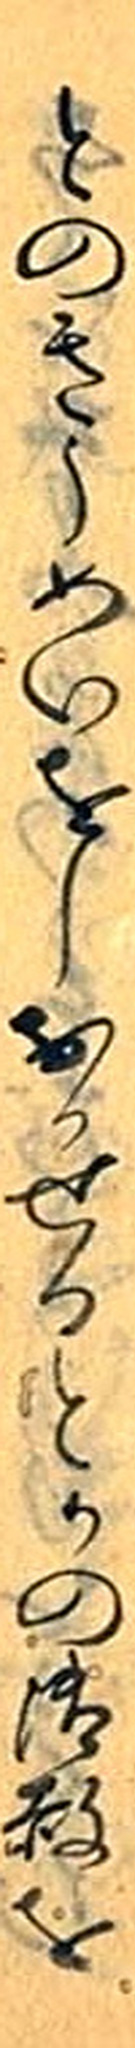とのきうめいをしおかせるとかの御赦を
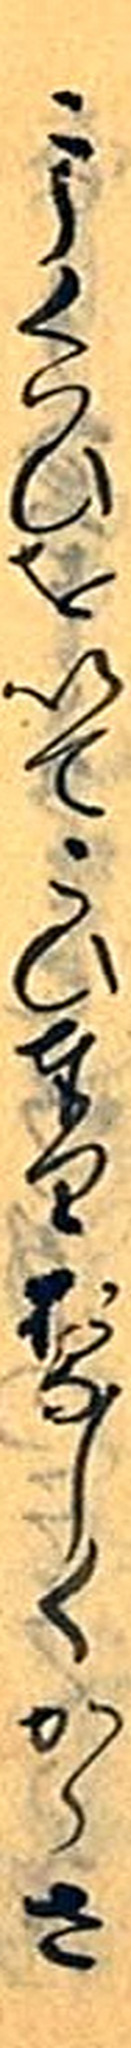こうくはいひを以てこひ奉りおなしくからさ
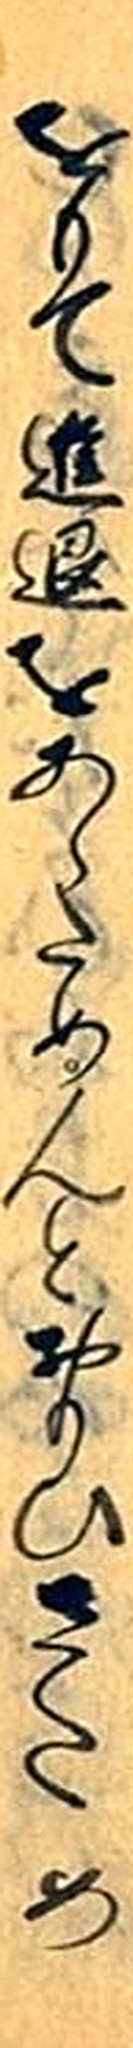をもて進退をあらためんとおもひさため
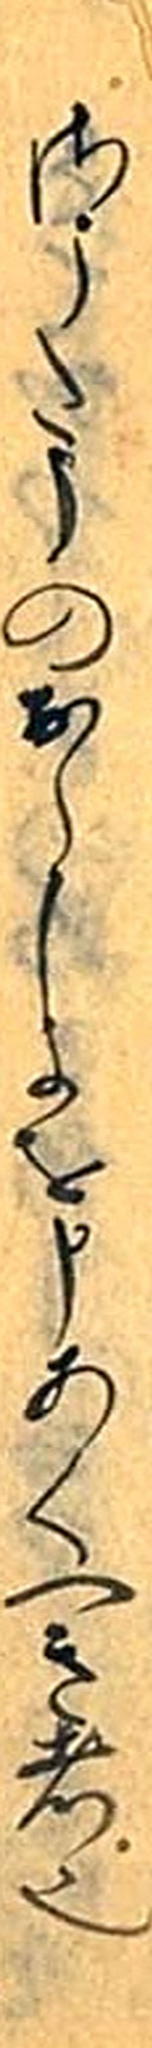さうたうのおらしよを申あくへき者也
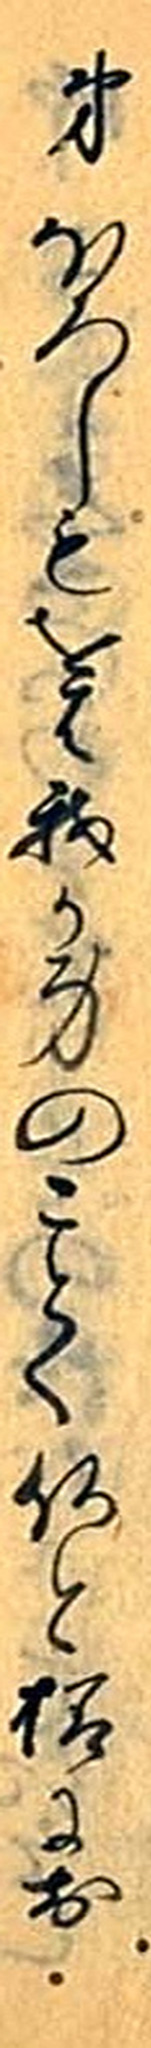弟ほろしもをは我か身のことく何と様にお
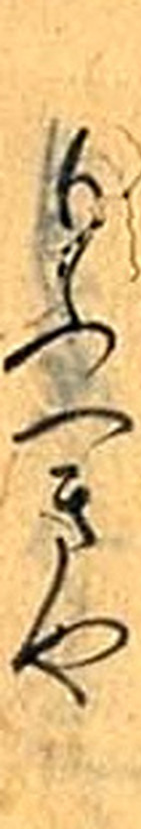もふへきや
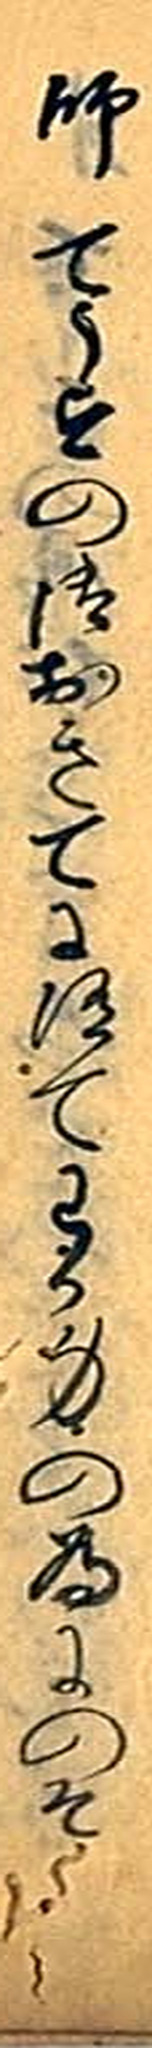師てうすの御おきてに随てわか身の為にのそ
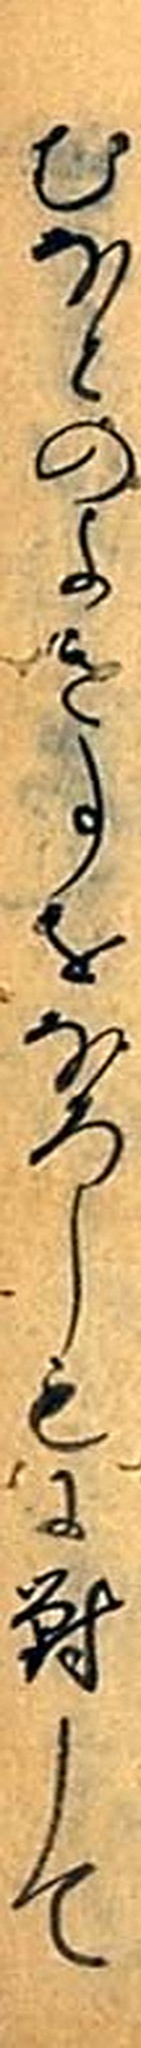むほとのよき事をほろしもに対して

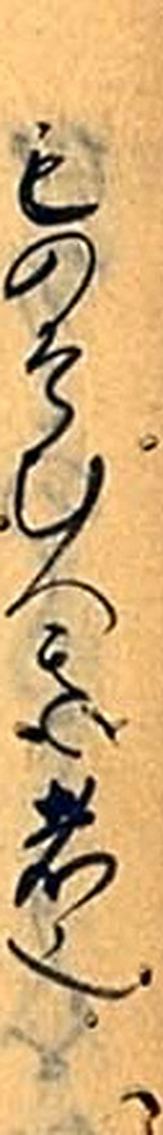ものそむへき者也
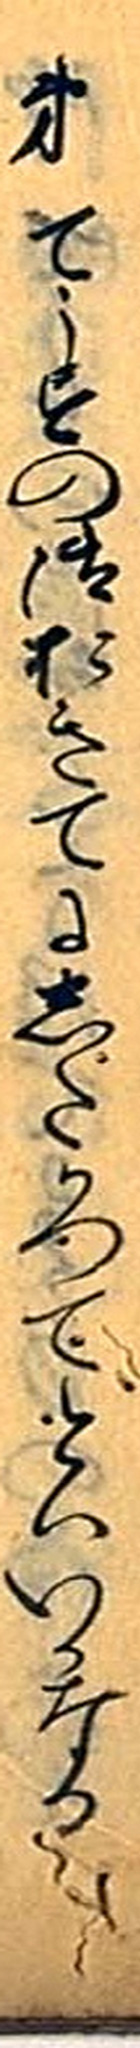弟てうすの御おきてにしたかつてとはいかなる
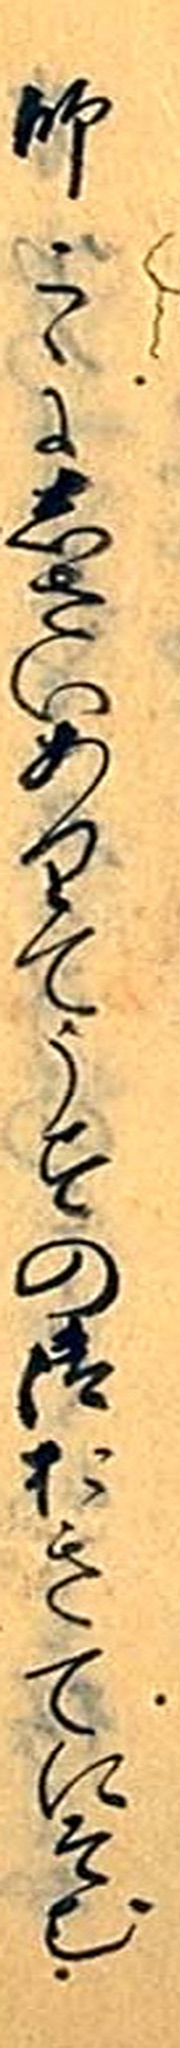師こゝにしさいありてうすの御おきてにそむ
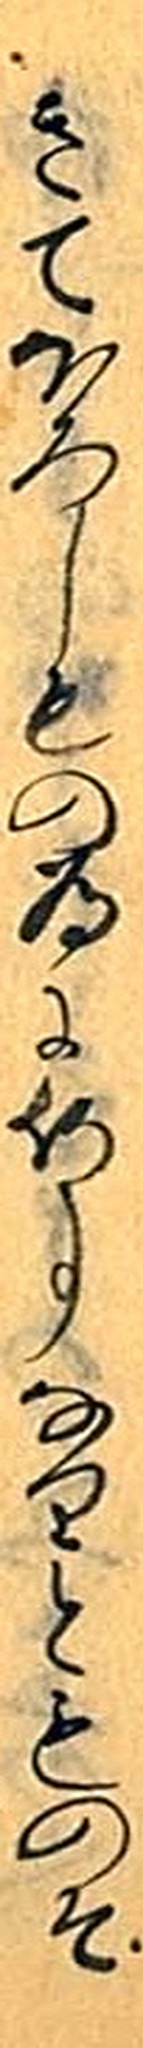きてほろしもの為に何事なりとものそ
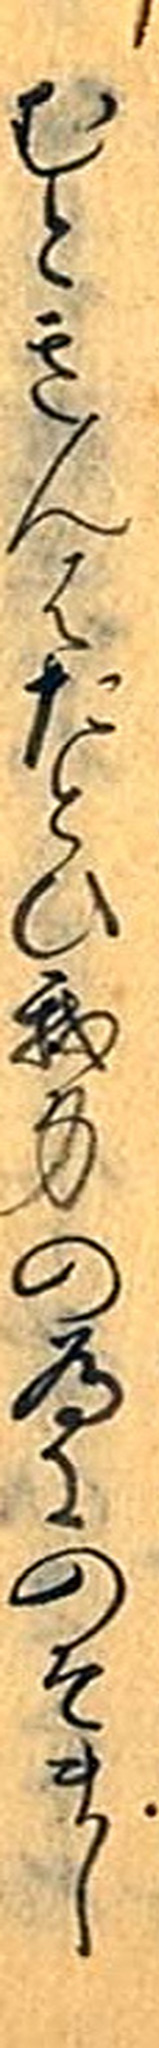むときんはたとひ我身の為にのそまし
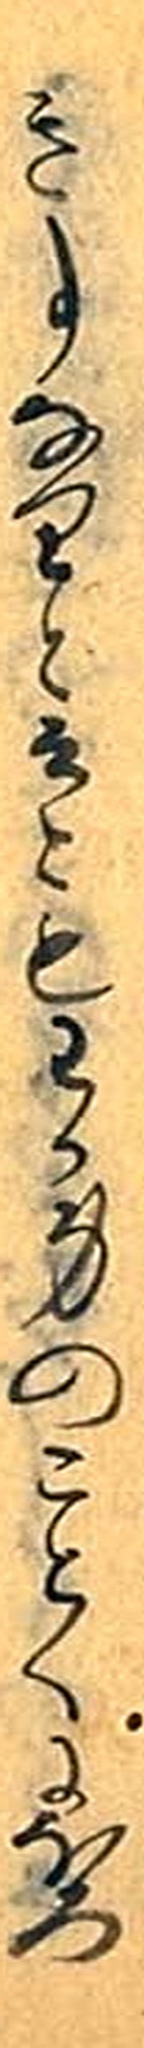き事なりと云ともわか身のことくにほろ
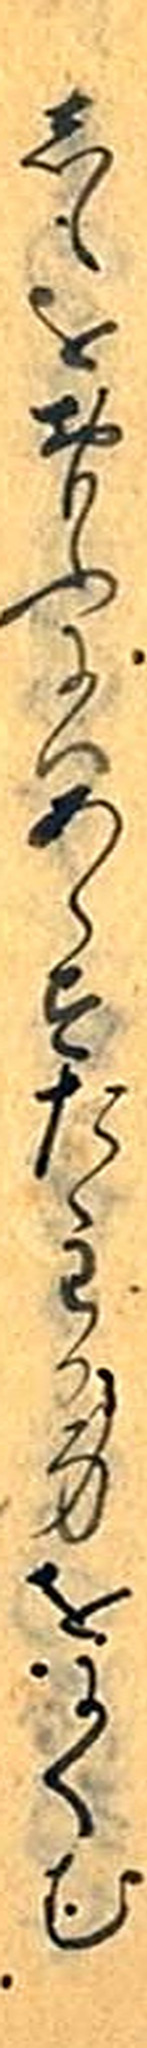しもをおもふにはあらすたゝわか身をにくむ
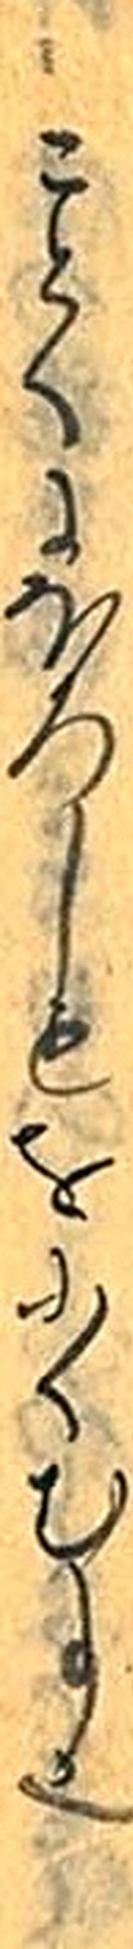ことくにほろしもをにくむ事也
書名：ドチリナ・キリシタン
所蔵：東京大学総合図書館 / General Library in the University of Tokyo
